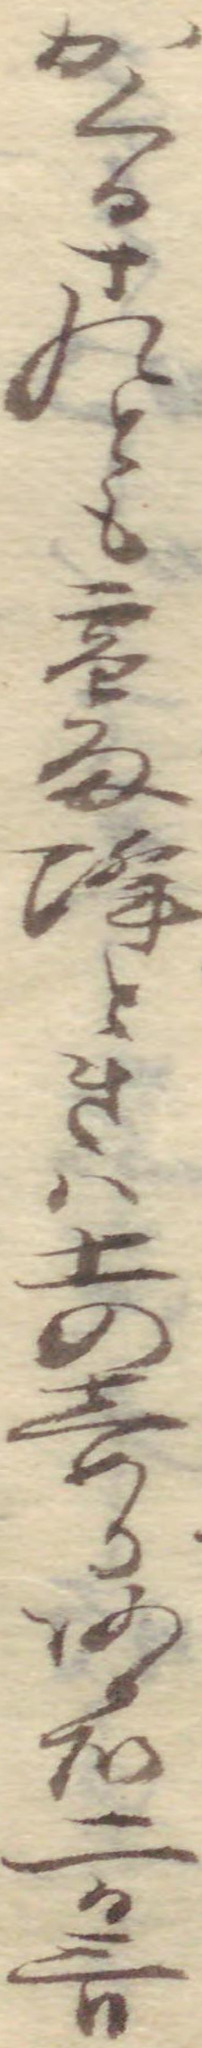かくるされとも雪雨降ときハ土のしめりある故二日三日
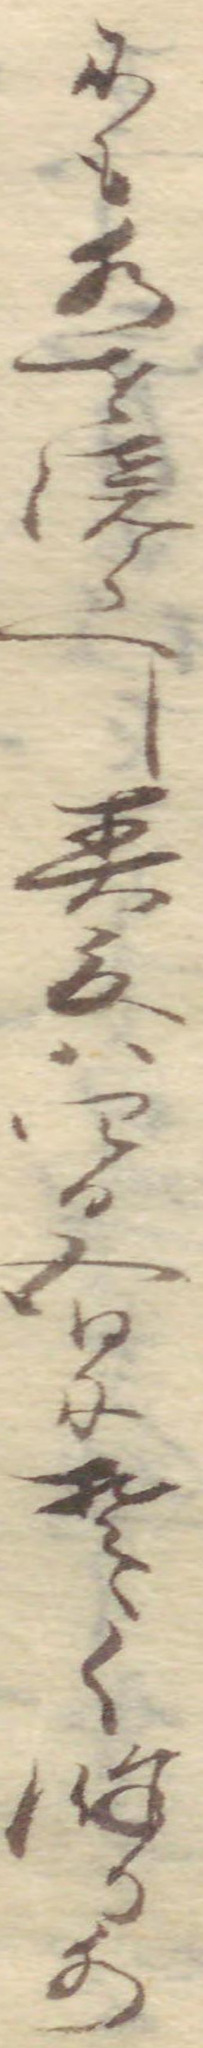にも水を澆くへし春夏ハ四日五日にそゝく餘り水
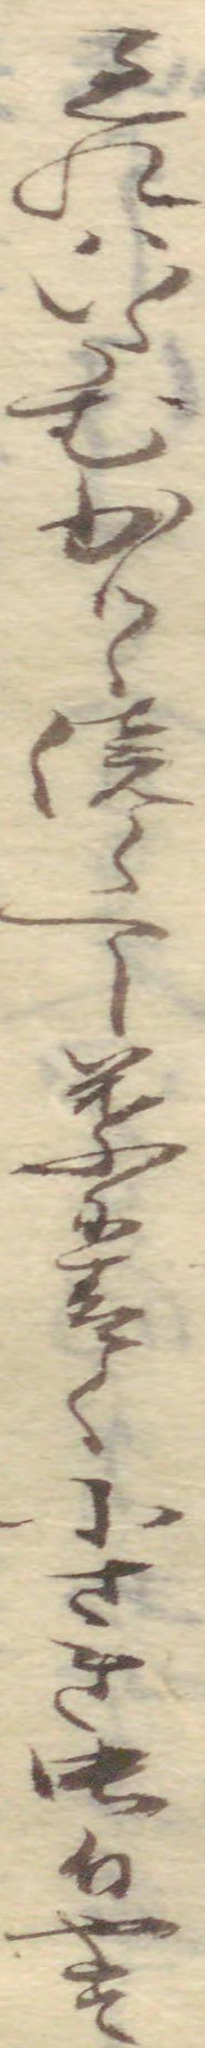過れハいたむ少ツヽ澆くへし葉に青く小さき虫付やす
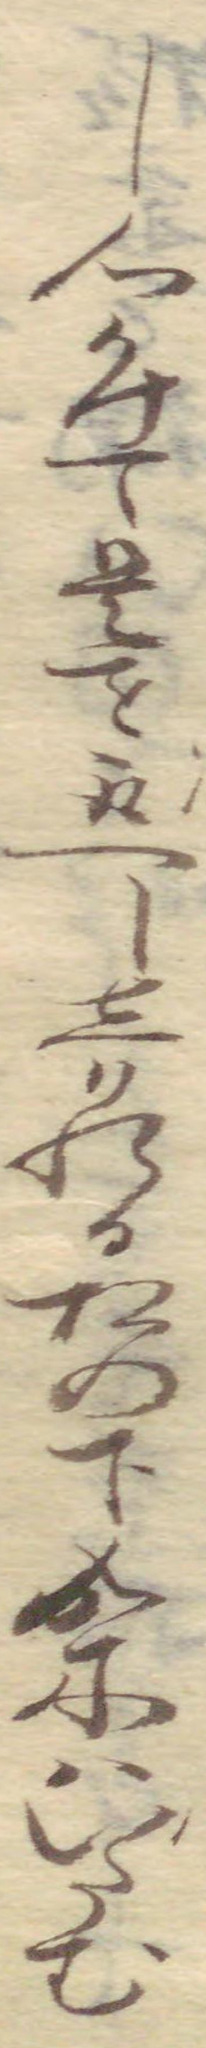し心かけて是を取へししけれる松の下成木ハいたむ
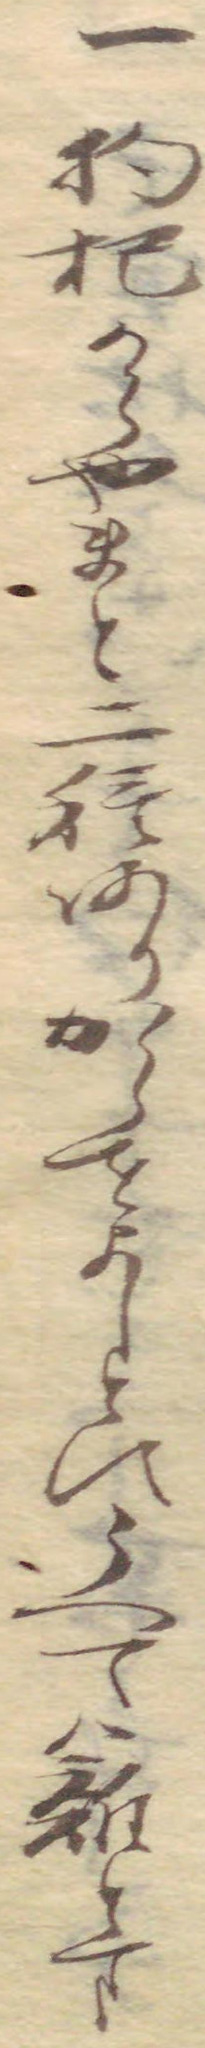一枸杞からやまと二種ありからをよしとすうへて籬とす

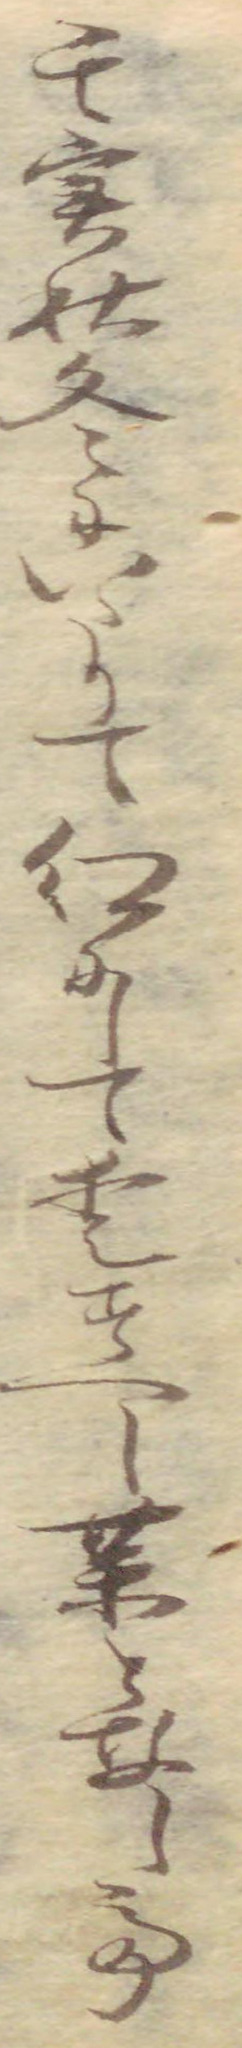其実秋冬にいたりて紅にして愛すへし薬となして
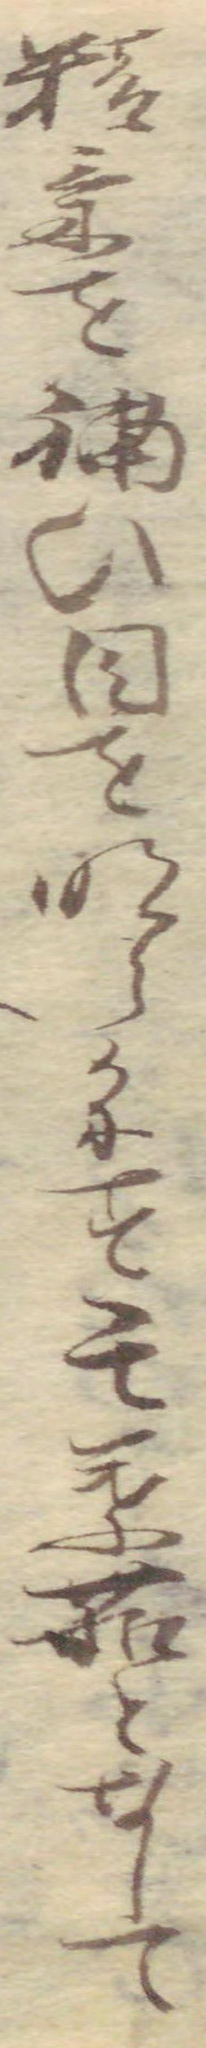精気を補ひ目を明らかにす其葉茹となして
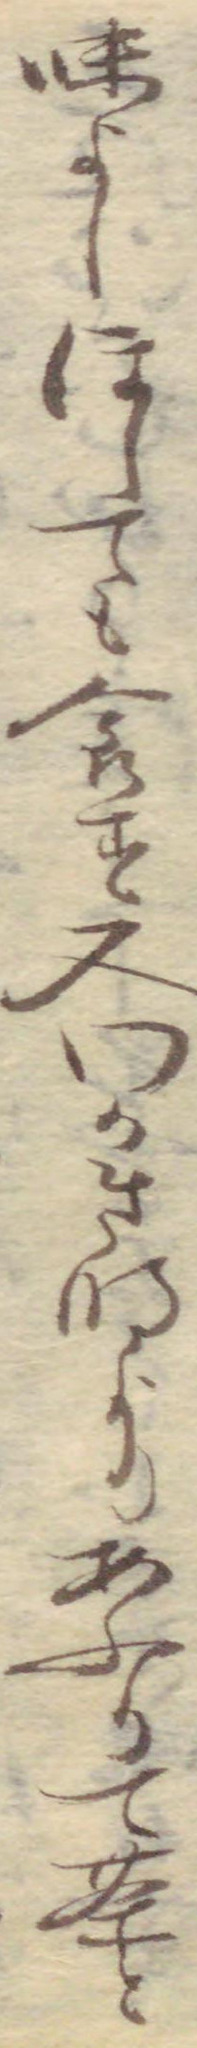味よしほしても食す又わかき時よりあふりて茶と
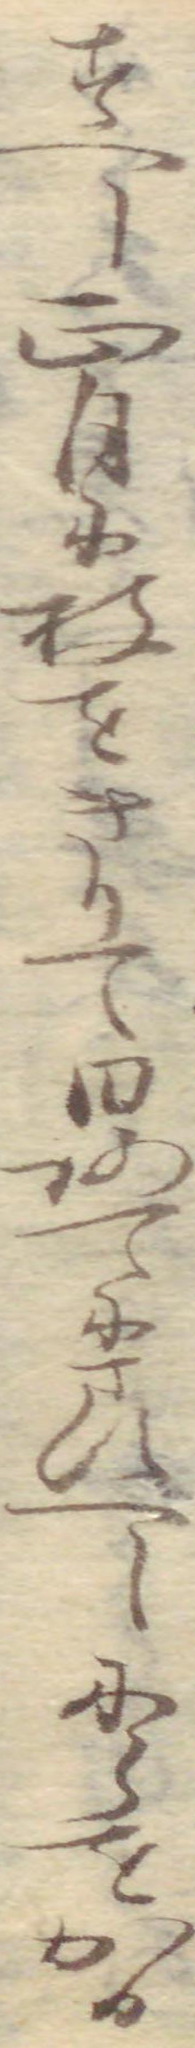すへし正月に枝をきりて日あてにさすへしにらをかる
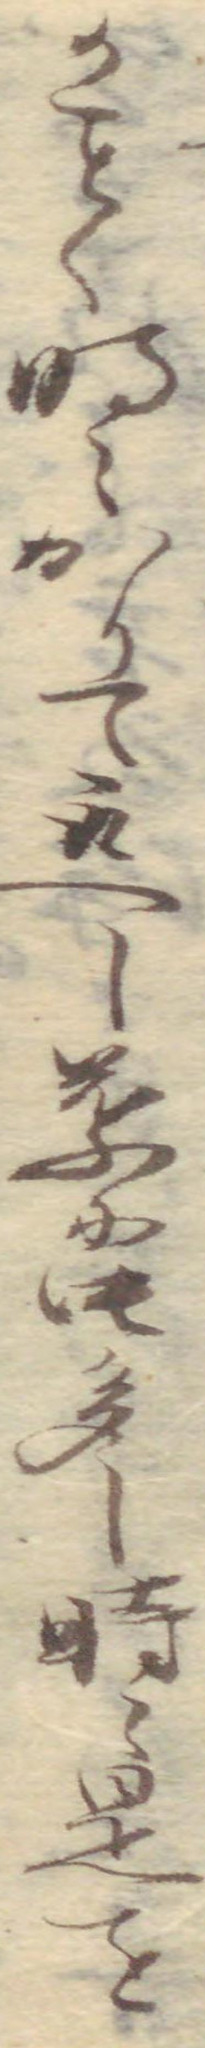かことく時々かりて取へし葉に虫多し時々是を
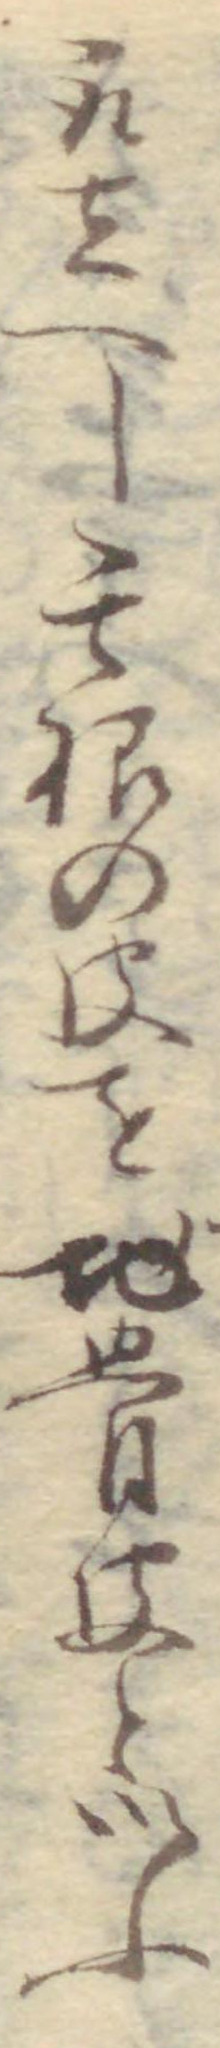取去へし其根の皮を地骨皮といふ
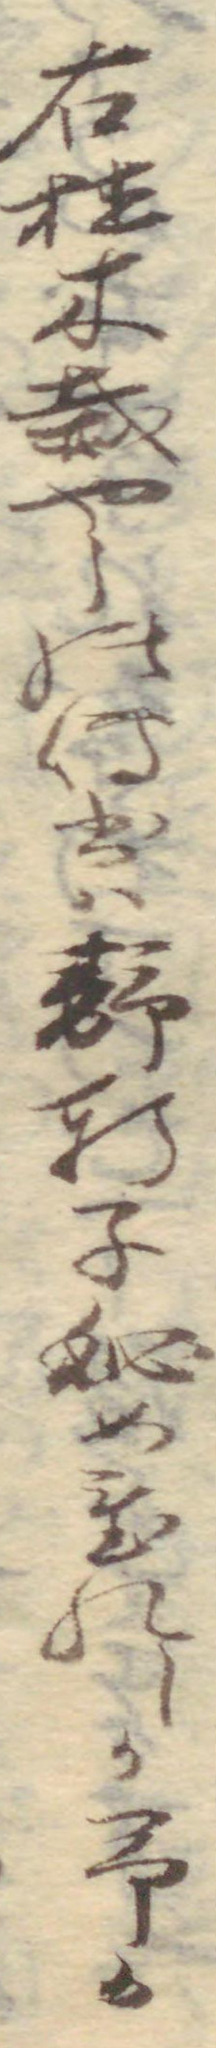右植木栽やうの伝書ハ静軒子秘め置れしか予か
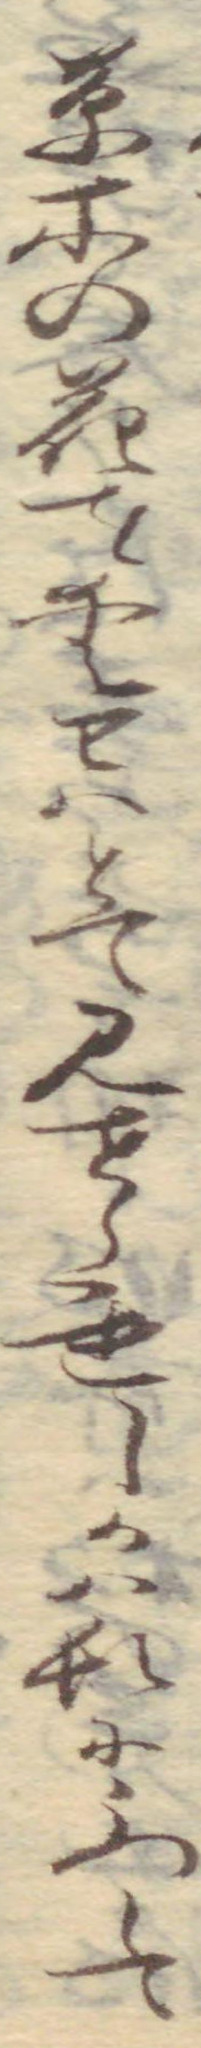草木の花を愛せハとて見せられしかハ頓にうつして
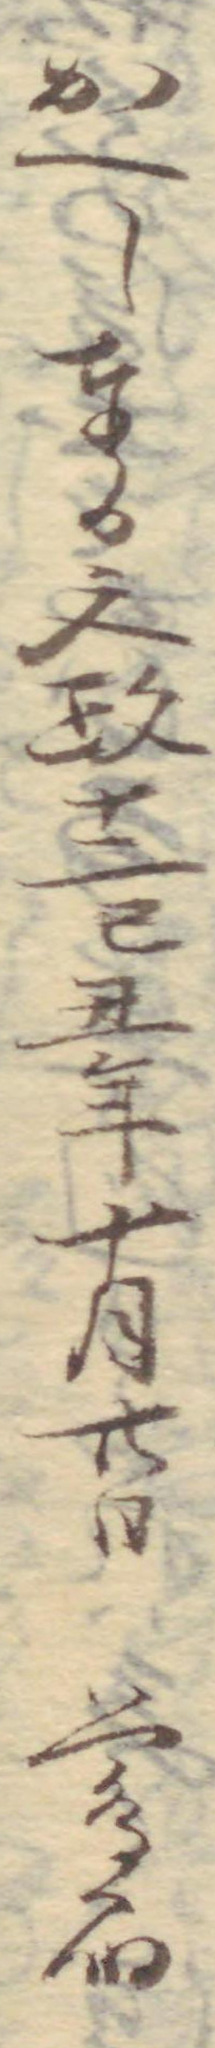かへし奉る文政十二己丑年十月廿日鶯宿

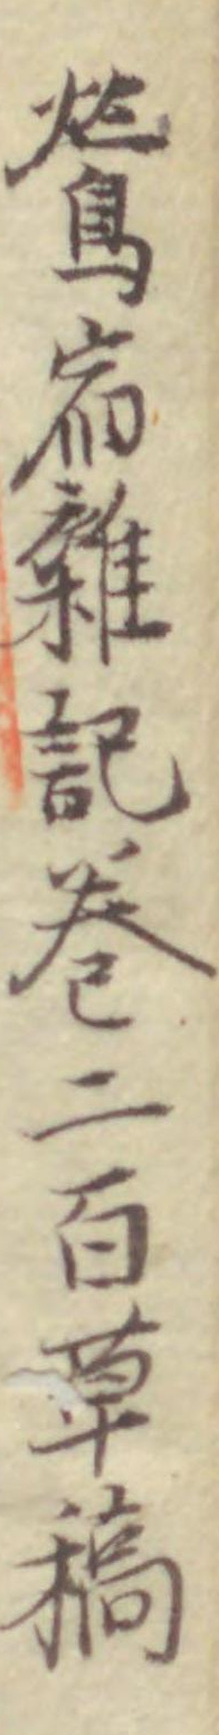鶯宿雑記巻二百草稿
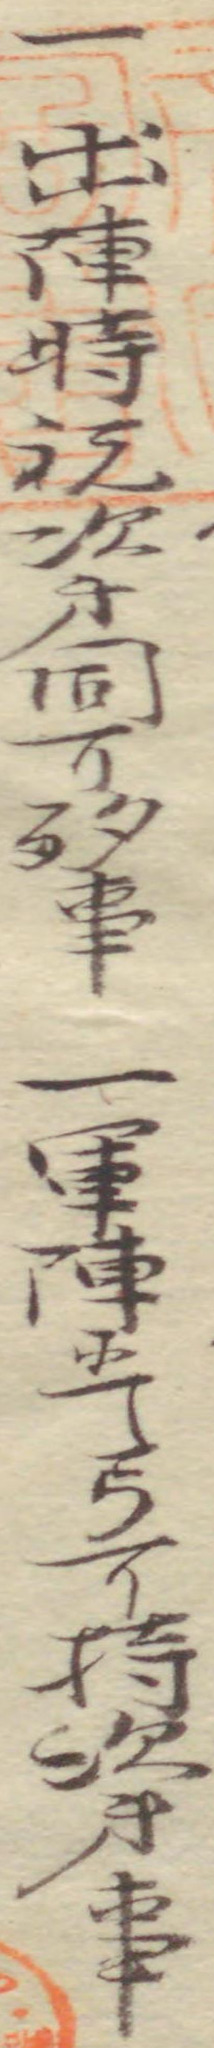一出陣時祝次第同可酌事一軍陣にて弓可持次第事
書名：鶯宿雑記. 巻199-200
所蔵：国立国会図書館 National Diet Library, JAPAN
